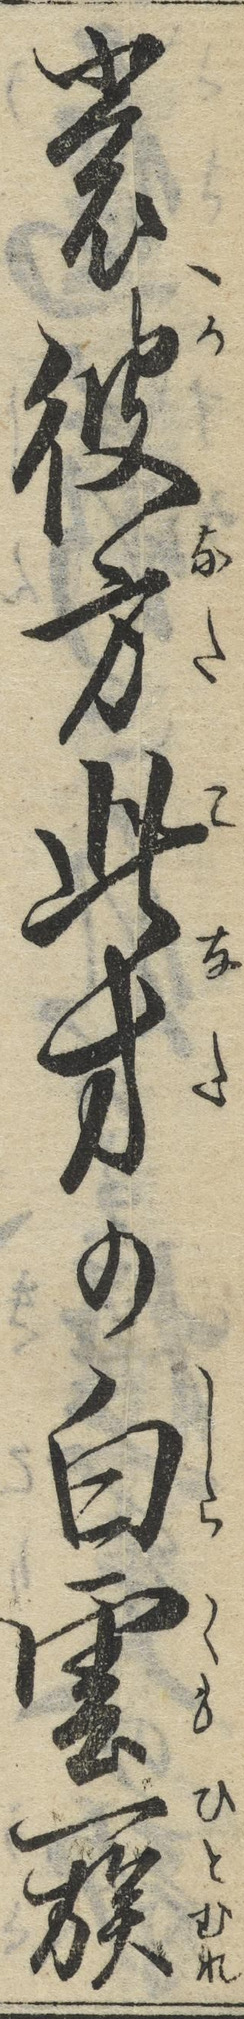も、彼方此方の白雲一族
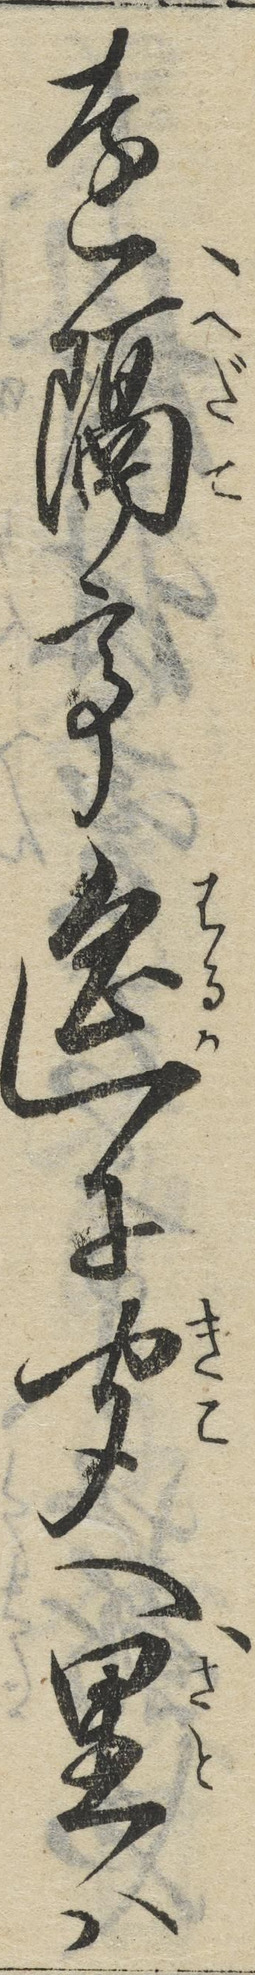を、隔て遥に聞へ、里は
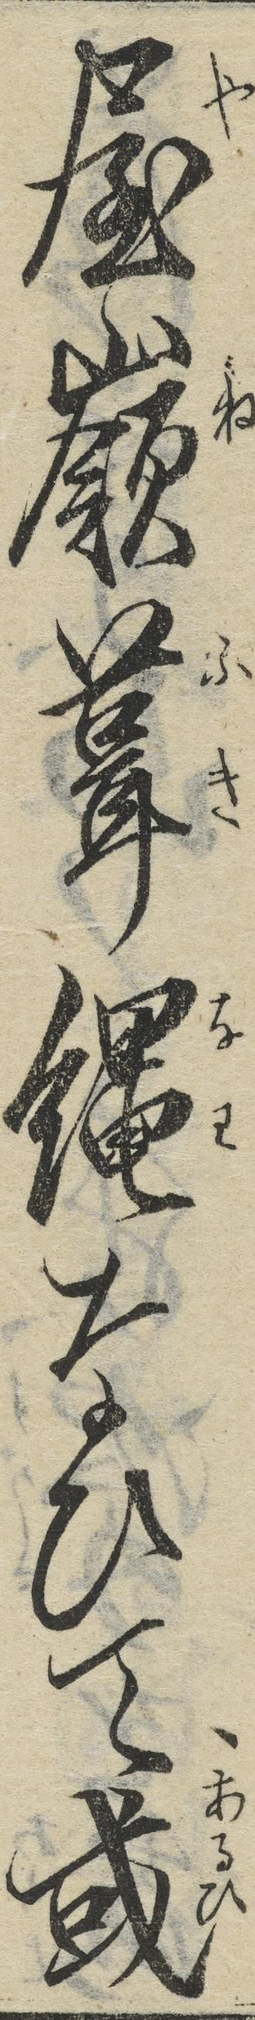屋嶺葺縄なひて、或
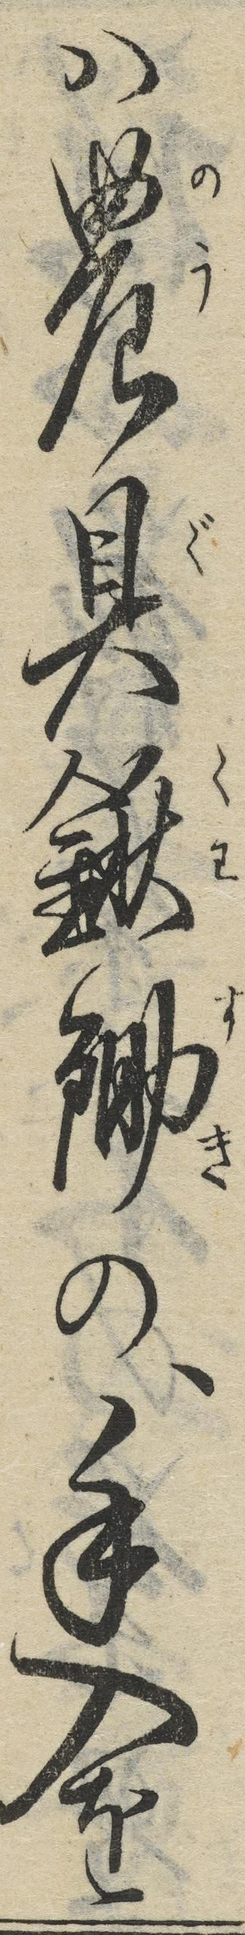は農具鍬鋤の、手入を
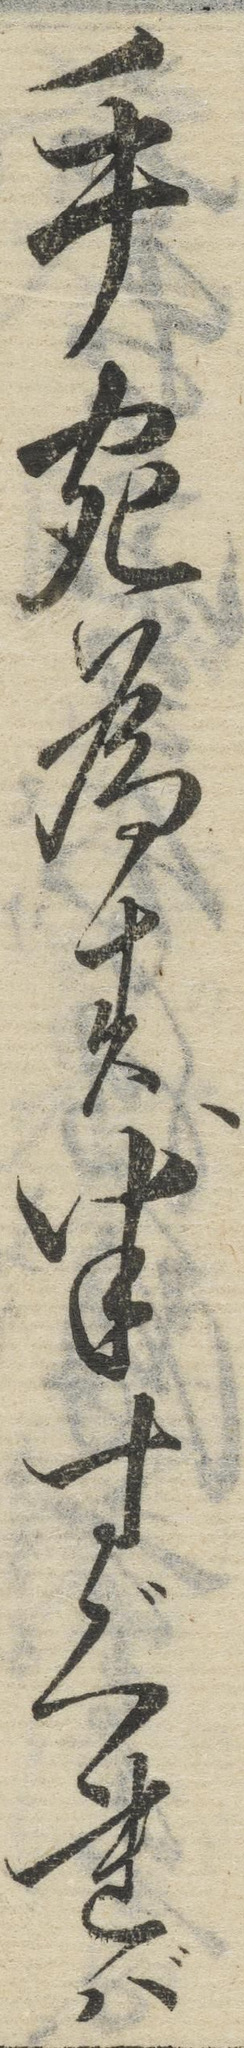手宛為す、半すぐれば
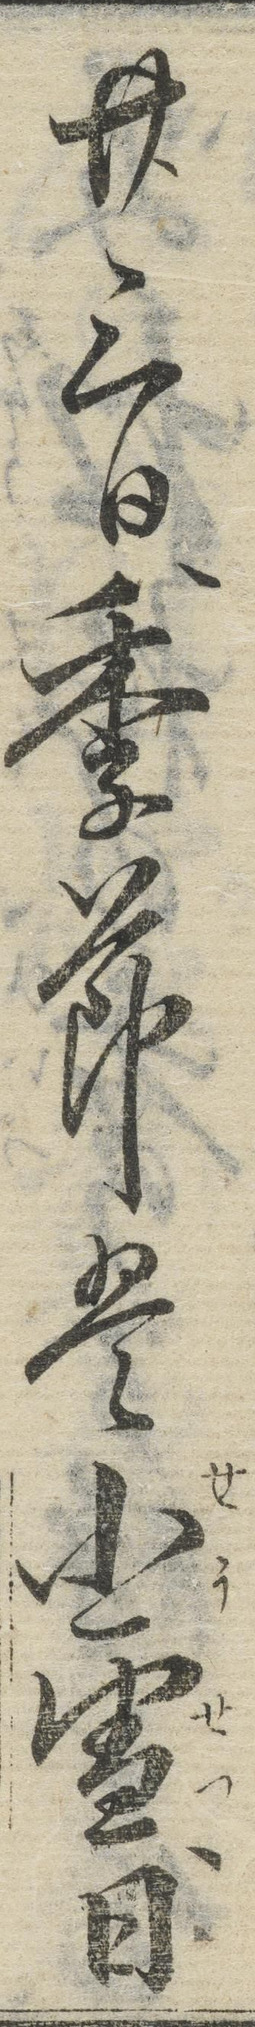廿三日、季節は小雪、日
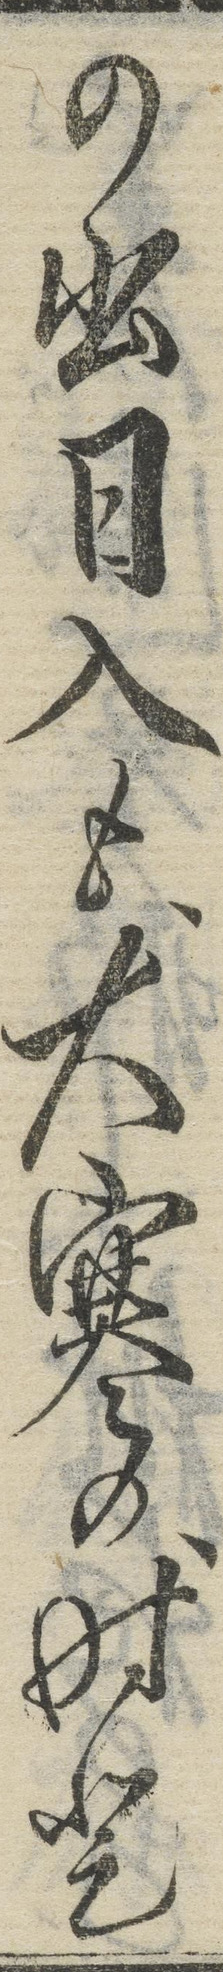の出日入も、大寒の、時と
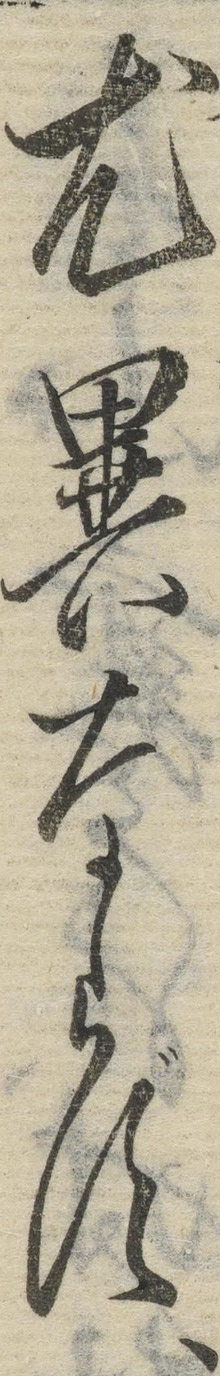尤異ならず、
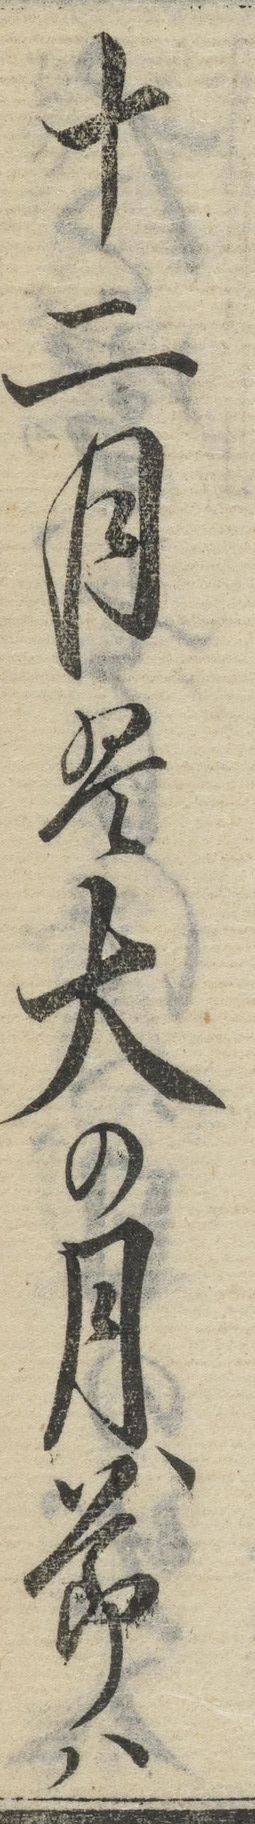十二月は大の月、節は

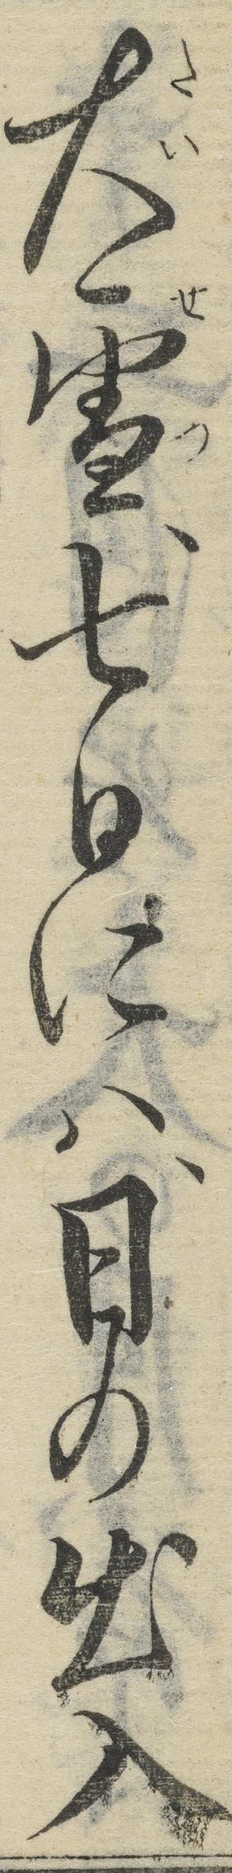大雪、七日には、日の出入
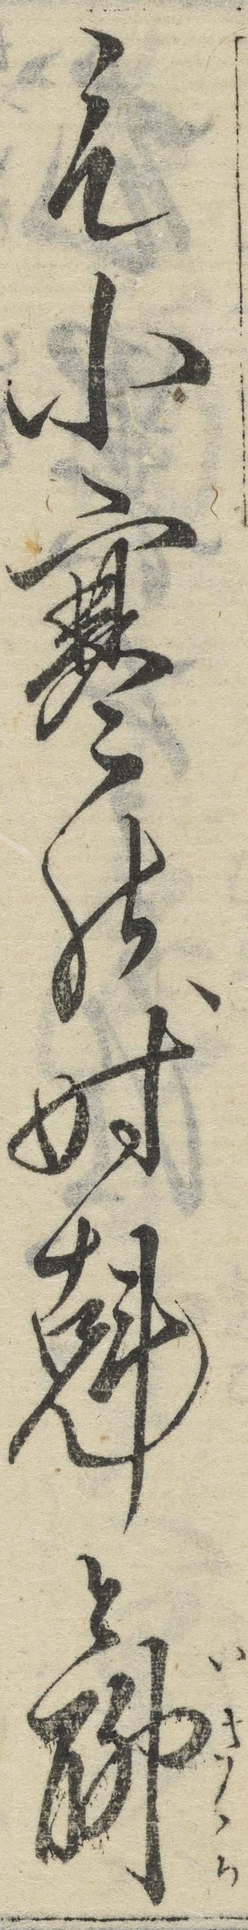も小寒の、時刻と聊
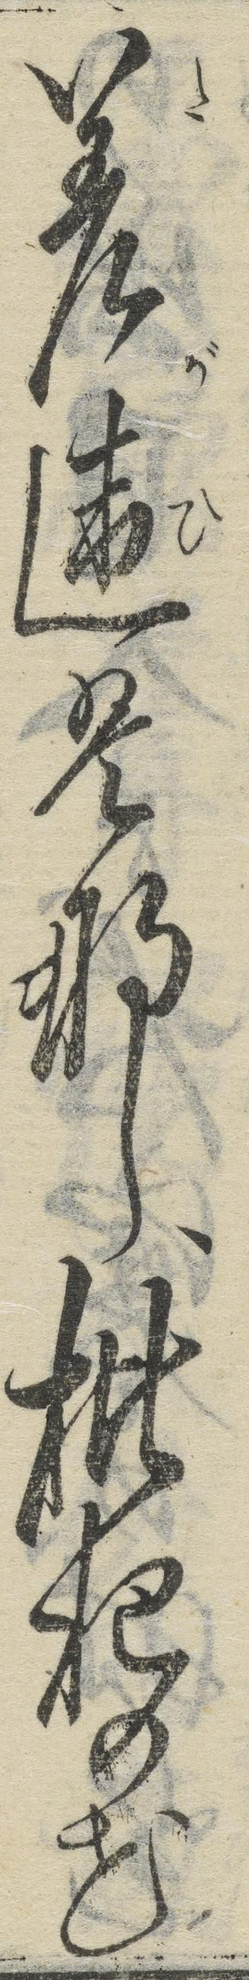差違はなし、枇杷の花
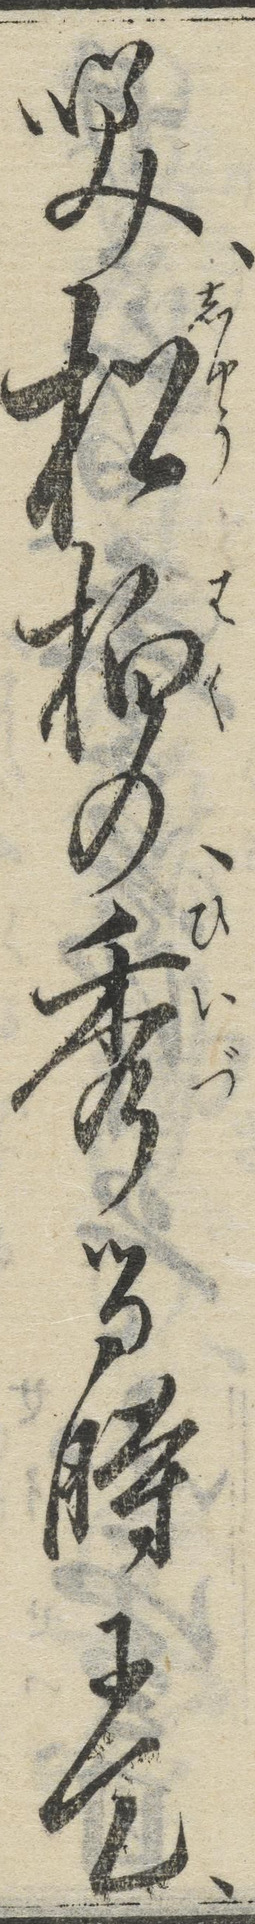咲、松柏の、秀る時にて、
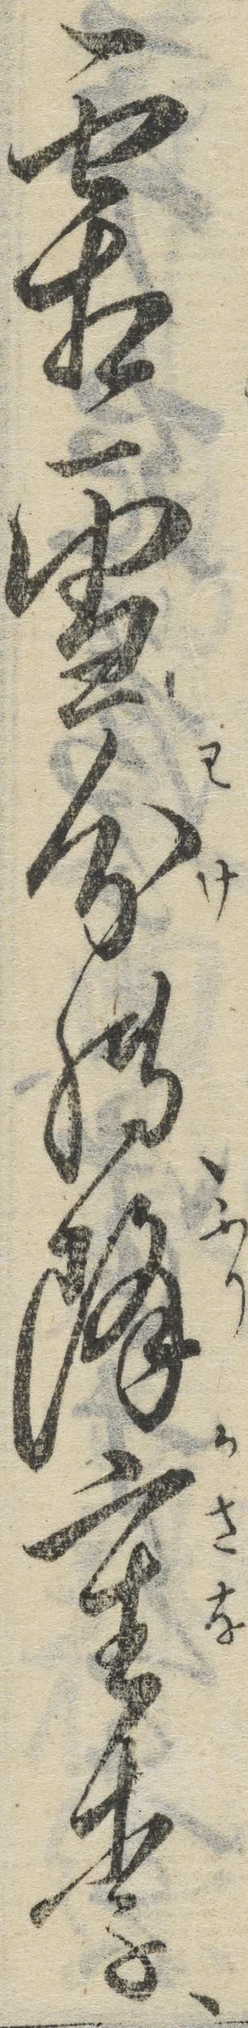霜雪分て、降重り、
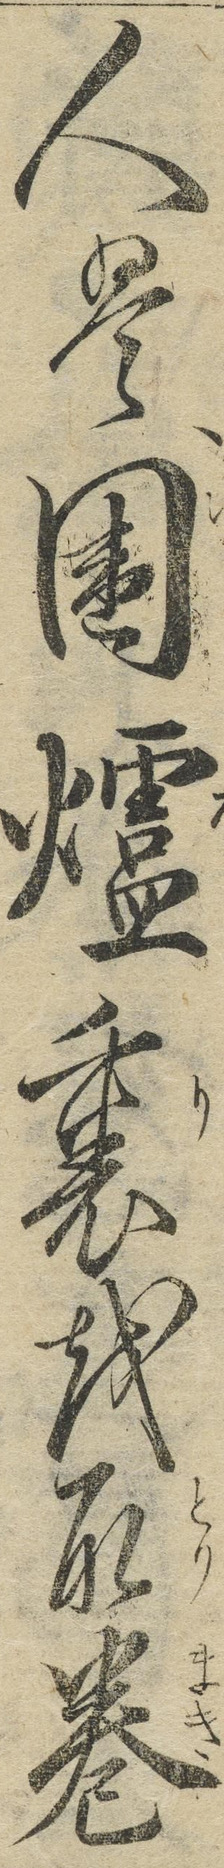人は、囲炉裏を取巻
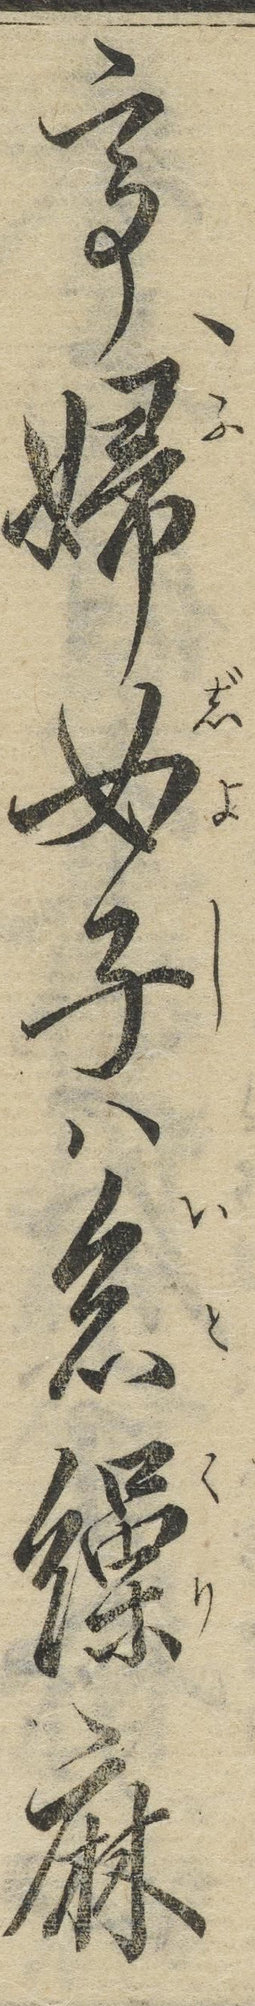て、婦女子は糸繰麻
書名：暦日往来　單
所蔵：東京大学地震研究所図書室 Earthquake Research Institute Library, The University of Tokyo, JAPAN
